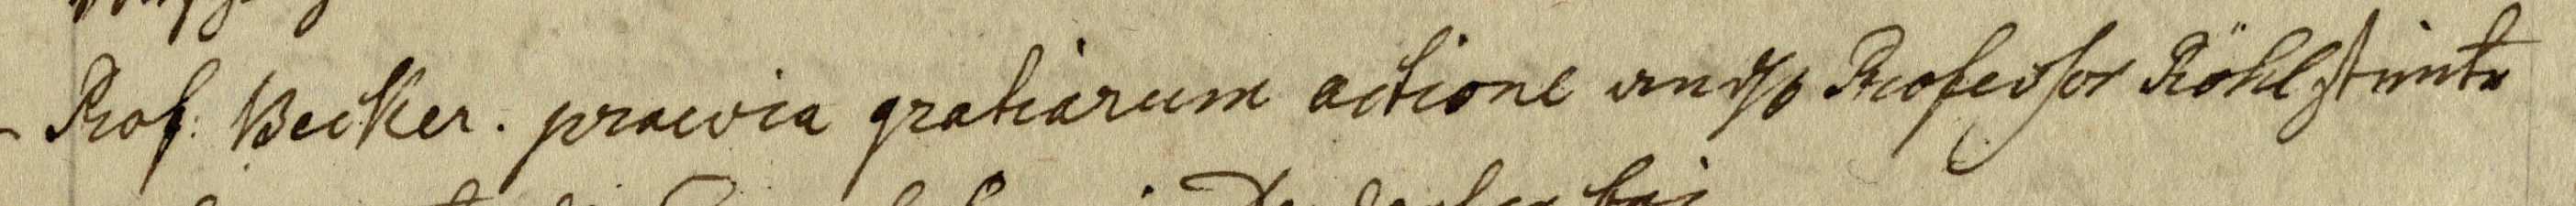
Prof. Becker. praevia gratiarum actione an dh Professor Röhl stimte
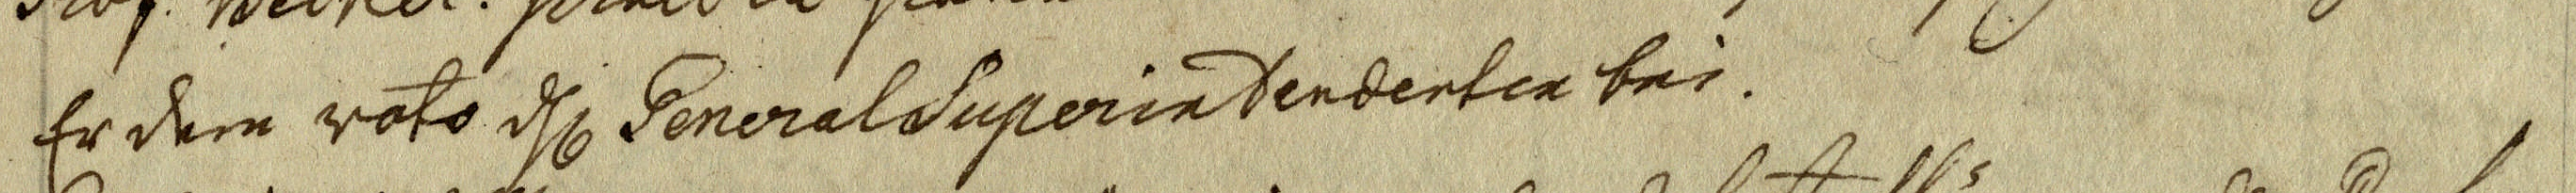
Er dem voto dh GeneralSuperintendenten bei.
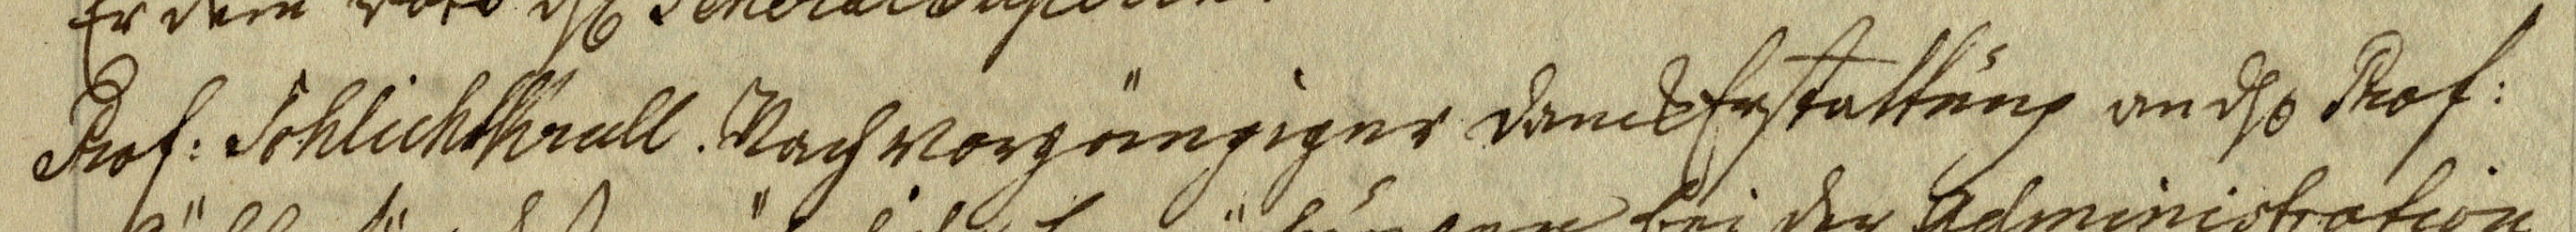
Prof. Schlichtkrull. Nach vorgängiger DankErstattung an dh Prof.
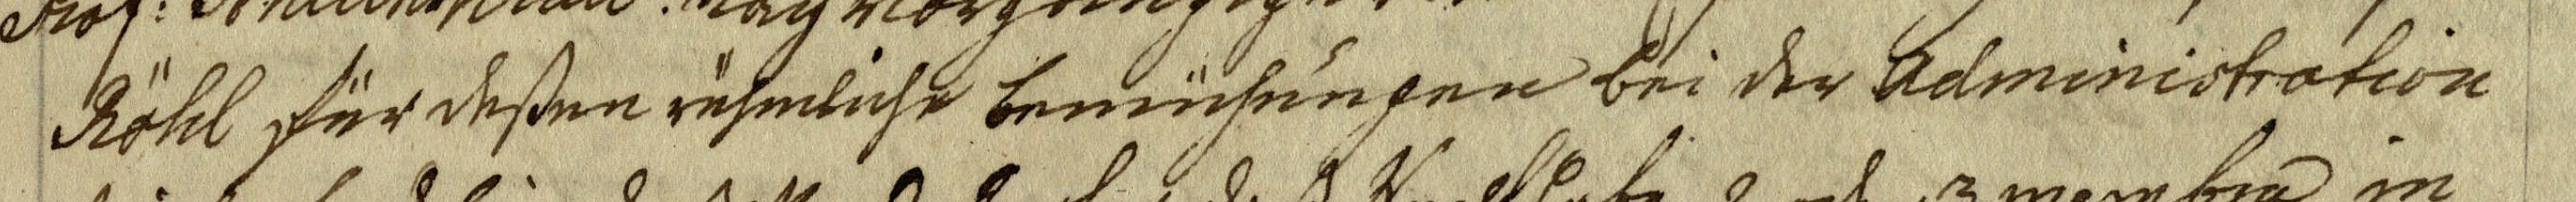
Röhl für deßen rühmliche Bemühungen bei der Administration
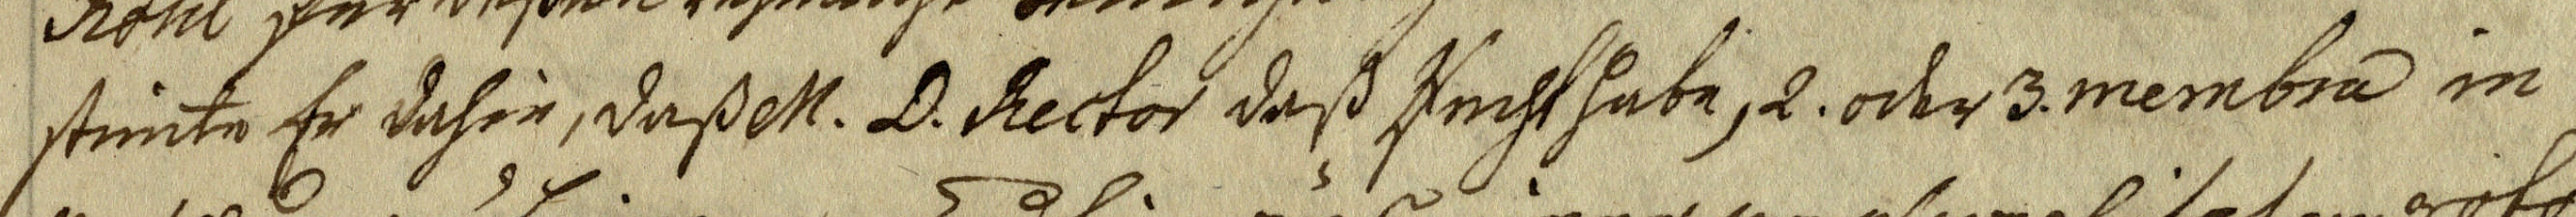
stimte Er dahin, daß M. D. Rector daß Recht habe, 2. oder 3. membra in
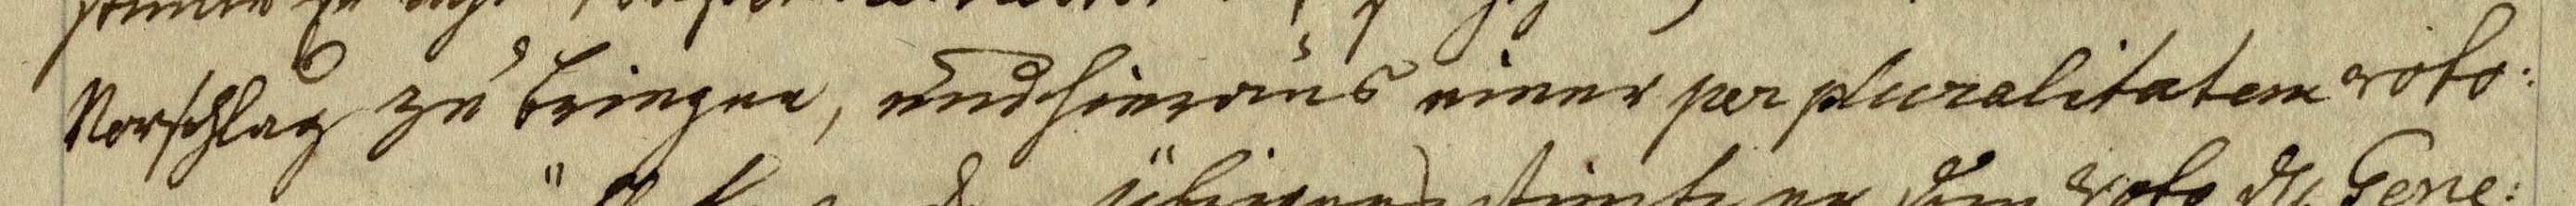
Vorschlag zu bringen, und hieraus einer per pluralitatem voto¬
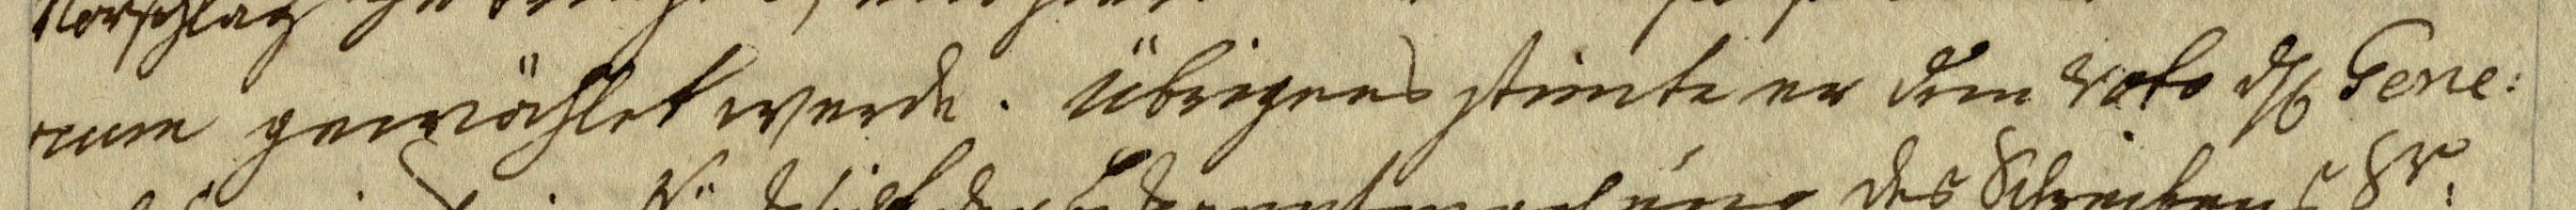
rum gewählet werde. Übrigens stimte er dem voto dh Gene¬
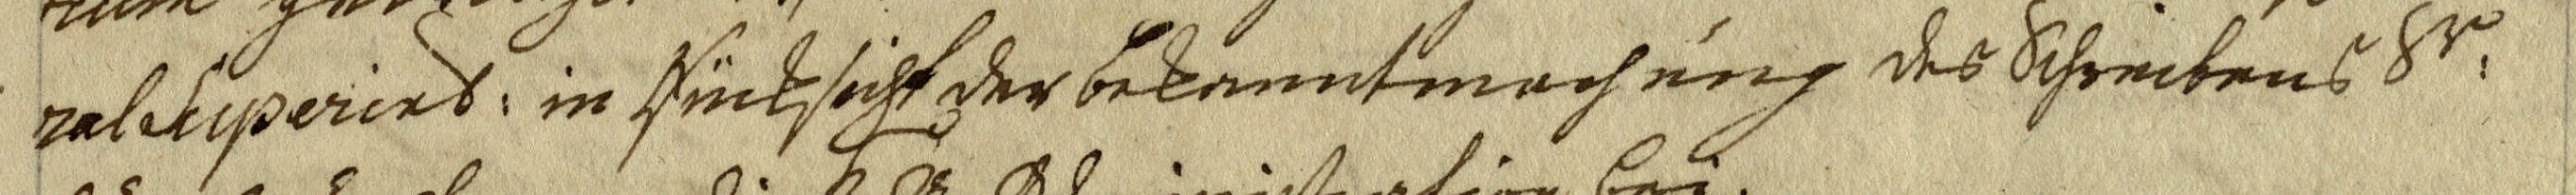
ralSuperint. in Rücksicht der Bekanntmachung des Schreibens Sr
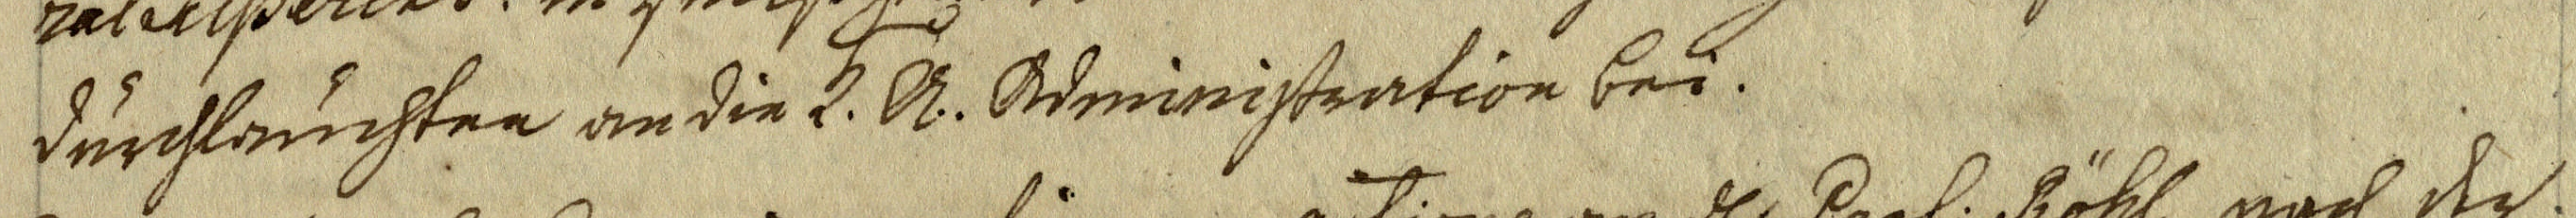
Durchlauchten an die K. A. Administration bei.
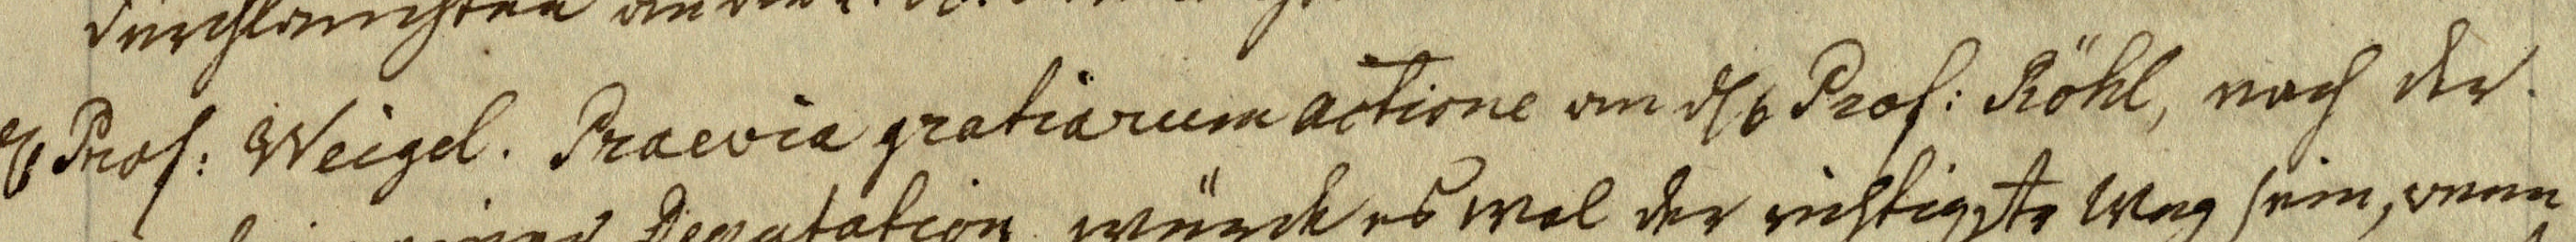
dh Prof. Weigel. Praevia gratiarum actione an dh Prof. Röhl, nach der
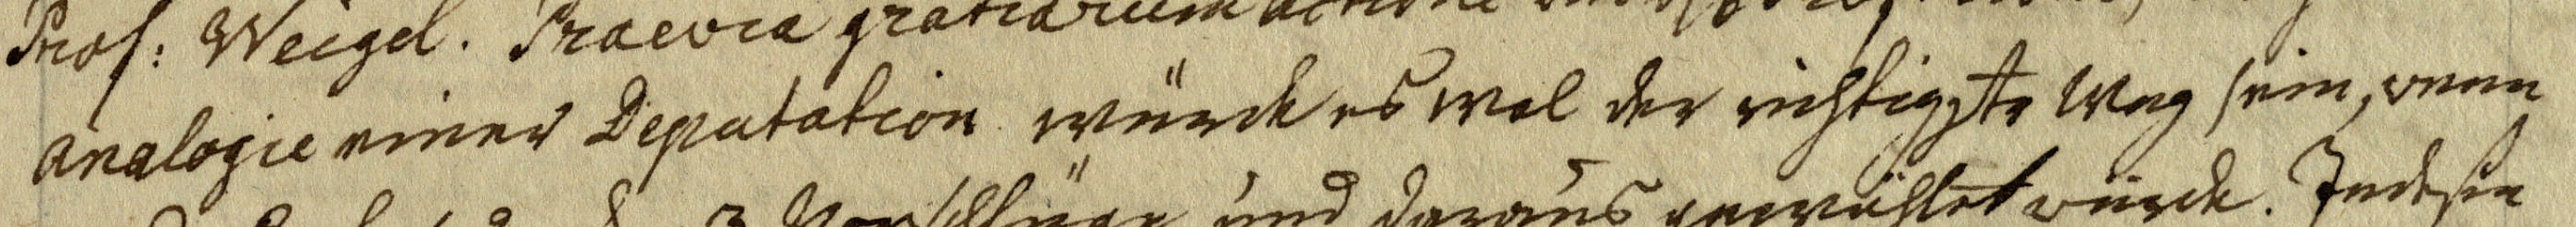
Analogie einer Deputation würde es wol der richtige Weg sein, wenn
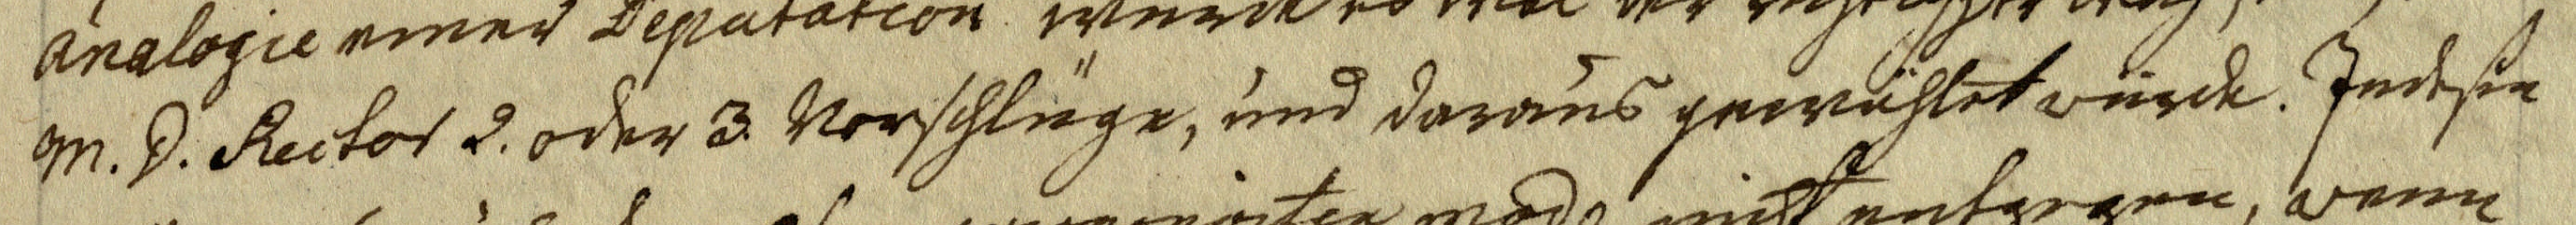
M. D. Rector 2. oder 3. Vorschläge, und daraus gewählet würde. Indeßen
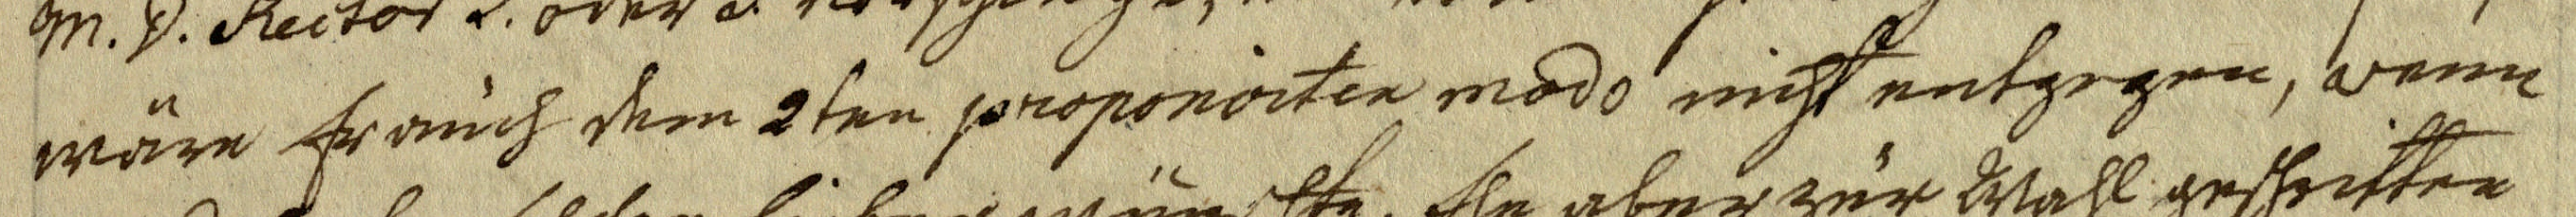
wäre Er auch dem 2ten proponirten modo nicht entgegen, wenn
